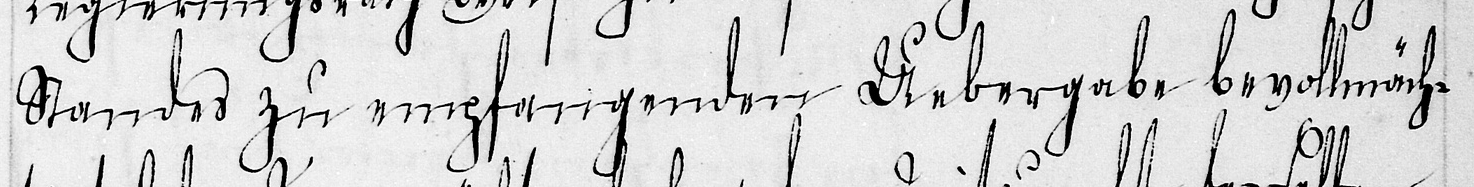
Standes zu empfangenden Uebergabe bevollmäch¬
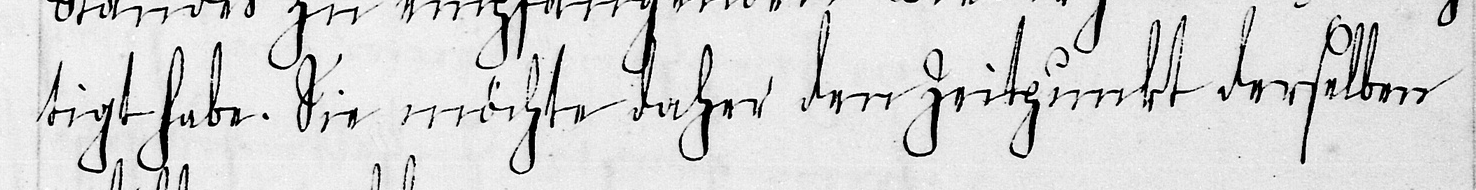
tigt habe. Sie möchte daher den Zeitpunkt derselben
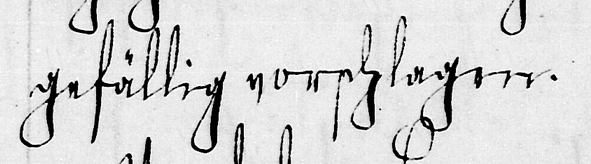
gefällig vorschlagen.
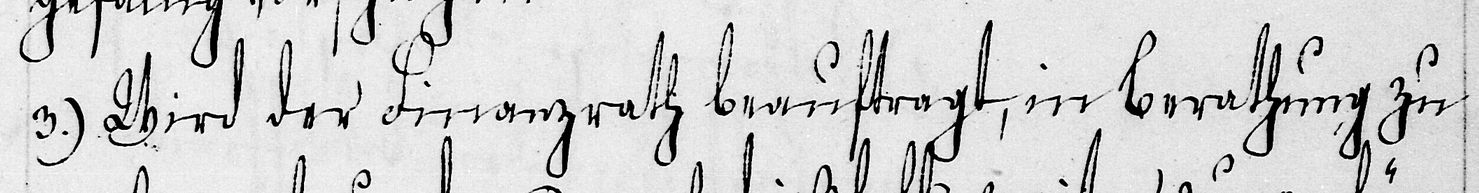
3.) Wird der Finanzrath beauftragt, in Berathung zu
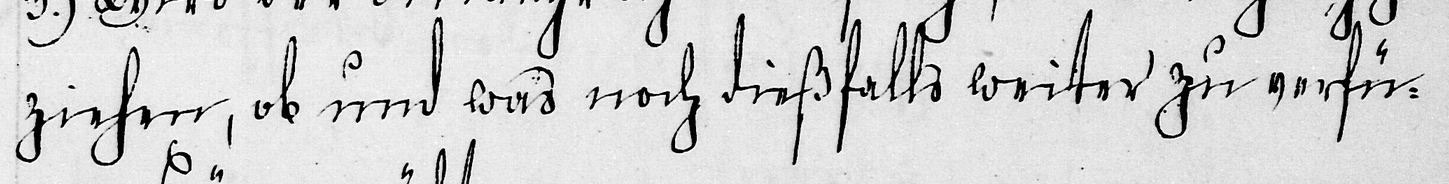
ziehen, ob und was noch dießfalls weiter zu verfü¬
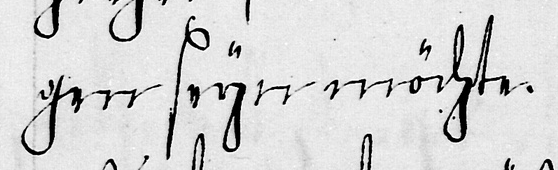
gen seyn möchte.
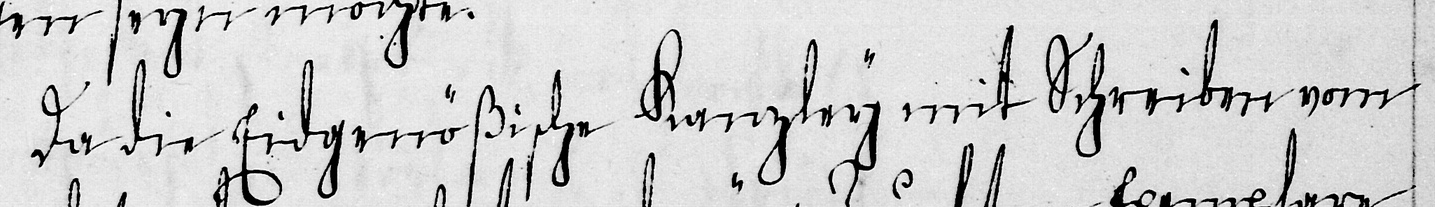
Da die Eidgenößische Kanzley mit Schreiben vom
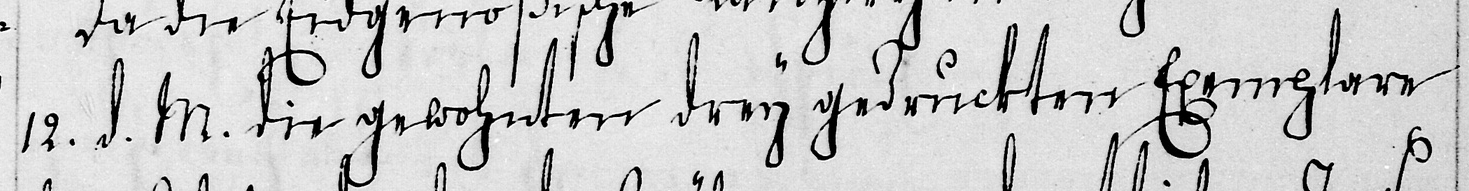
12. d. M. die gewohnten drey gedruckten Exemplare
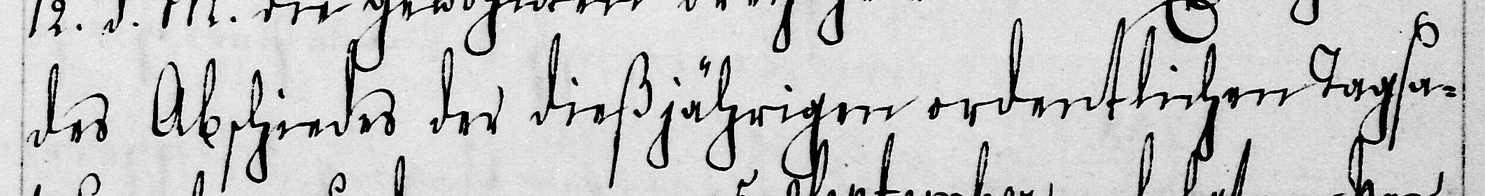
des Abschiedes der dießjährigen ordentlichen Tagsa¬
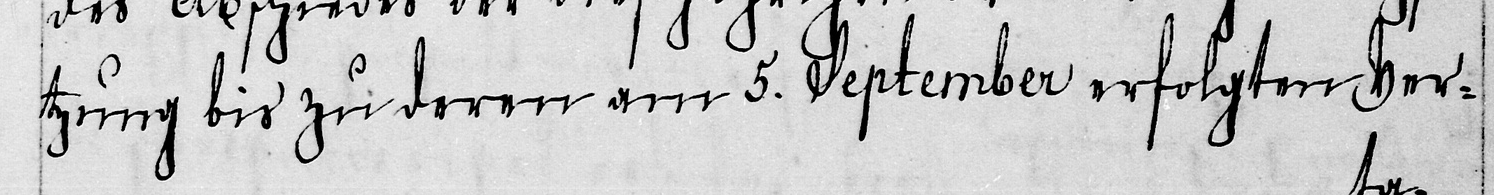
tzung bis zu deren am 5. September erfolgten Ver-
